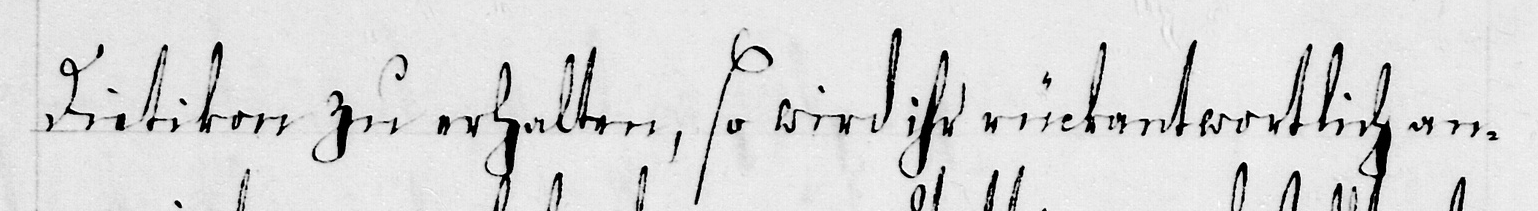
Dietikon zu erhalten, so wird ihr rückantwortlich an¬
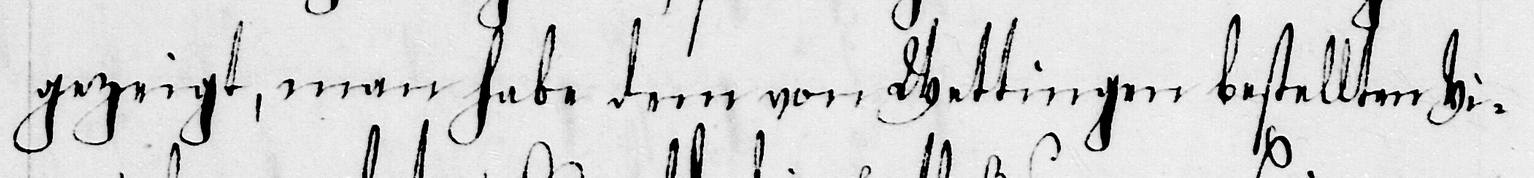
gezeigt, man habe dem von Wettingen bestellten Vi¬
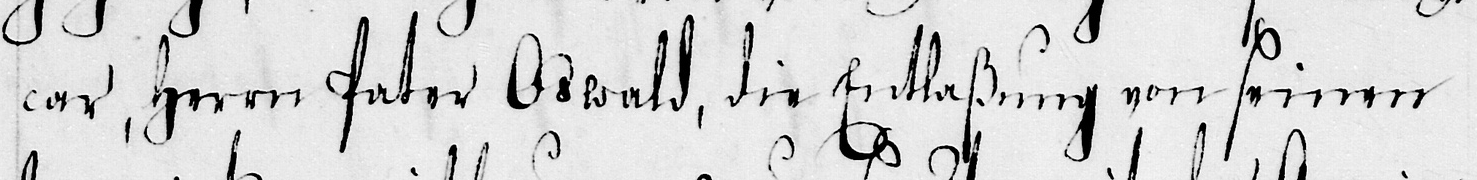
car, Herrn Pater Oswald, die Entlaßung von seinen
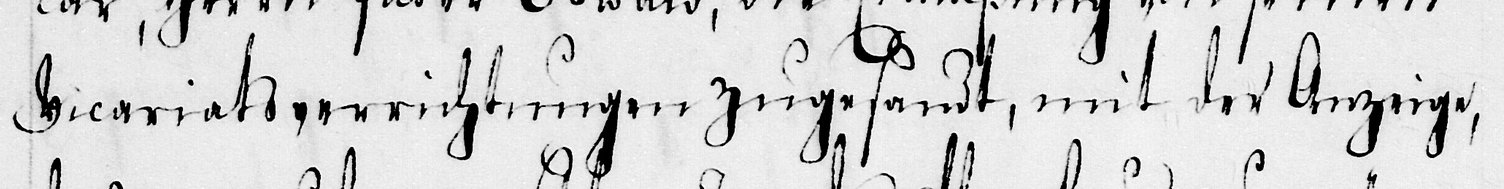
Vicariatsverrichtungen zugesandt, mit der Anzeige,
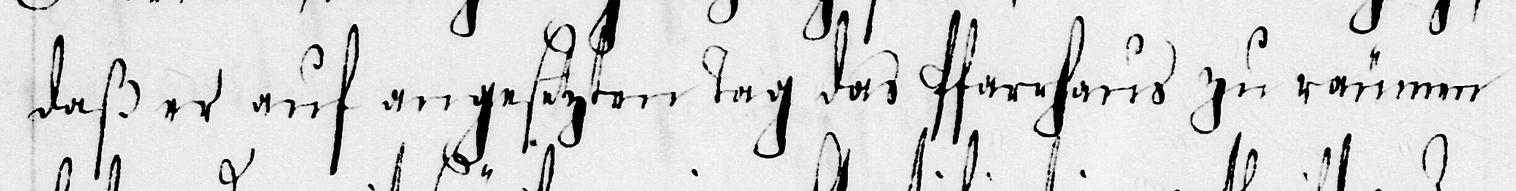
daß er auf angesetzten Tag das Pfarrhaus zu räumen
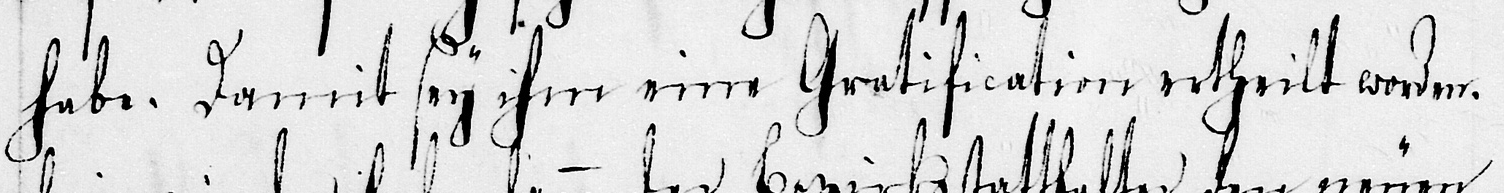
habe. Damit sey ihm eine Gratification ertheilt worden.
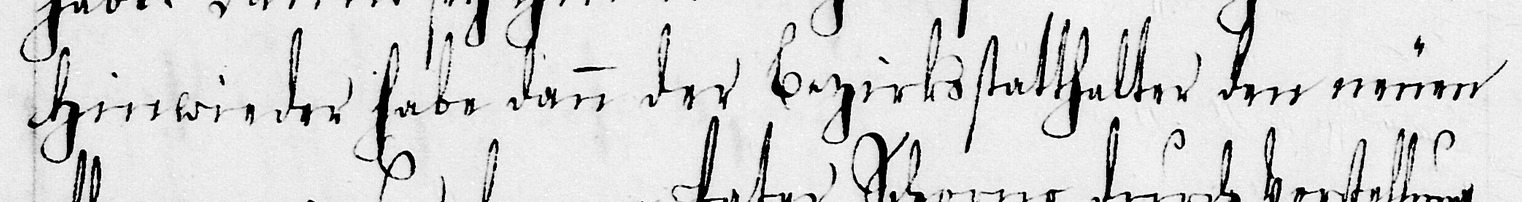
Hinwieder habe dann der Bezirksstatthalter den neuen
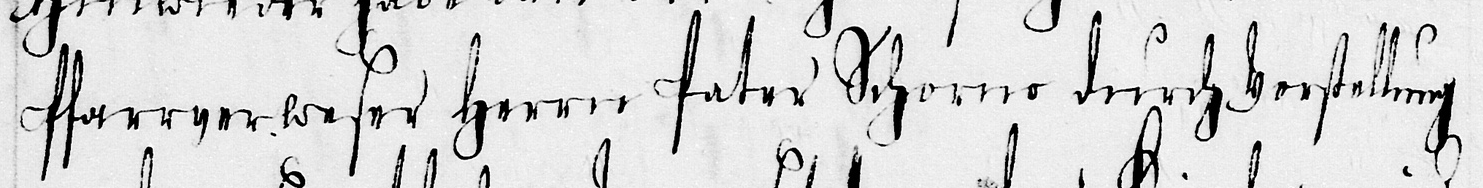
Pfarrverweser Herrn Pater Schorno durch Vorstellung
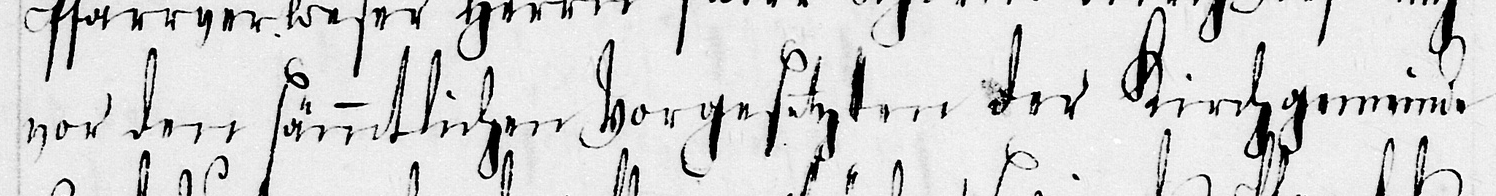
vor den sämmtlichen Vorgesetzten der Kirchgemeinde
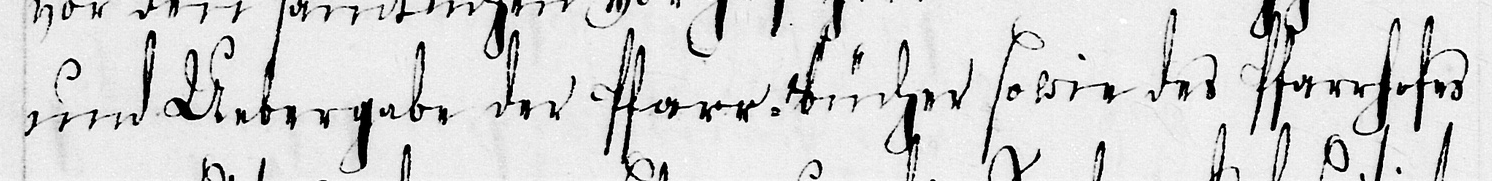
und Uebergabe der Pfarrbücher sowie des Pfarrhofes
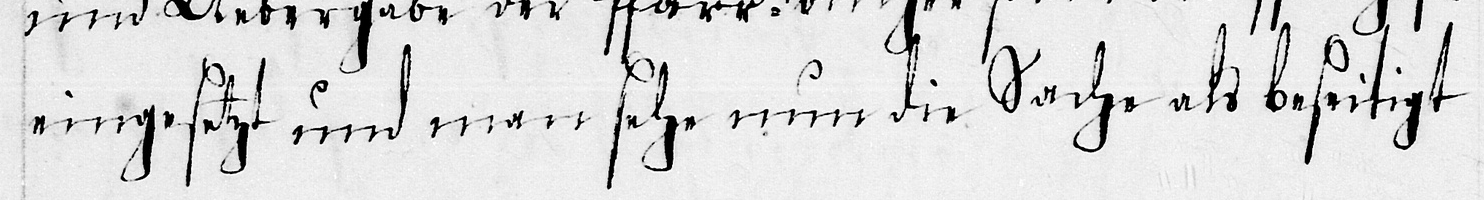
eingesetzt und man sehe nun die Sache als beseitigt
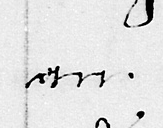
an.
